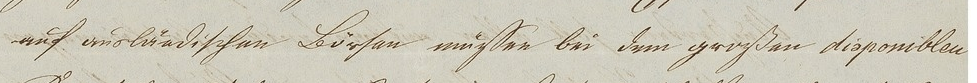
auf ausländischen Börsen müssten bei dem großen disponiblen
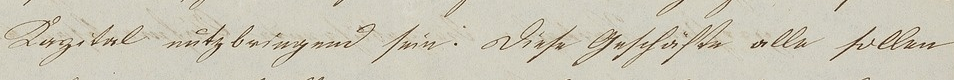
Kapital nutzbringend sein. Diese Geschäfte alle sollen
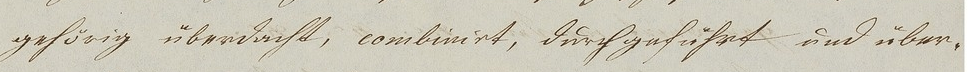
gehörig überdacht, combinirt, durchgeführt und über-
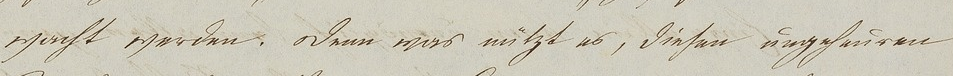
wacht werden. Denn was nützt es, diesen ungeheuren
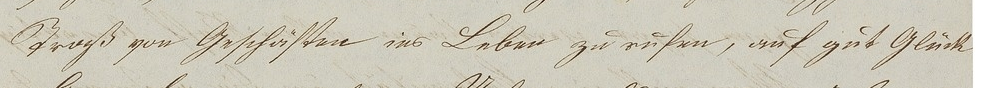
Troß von Geschäften ins Leben zu rufen, auf gut Glück
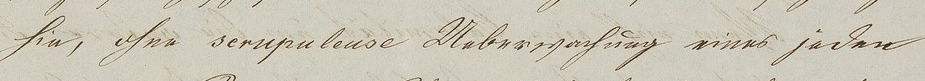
hin, ohne scrupuleuse Ueberwachung eines jeden
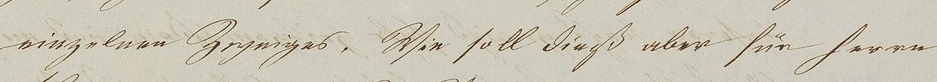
einzelnen Zweiges. Wie soll dieß aber für Herrn
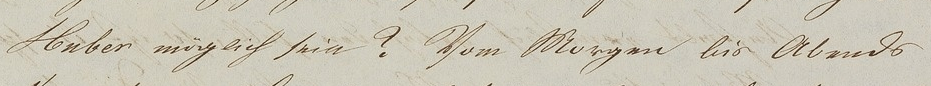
Huber möglich sein? Vom Morgen bis Abends
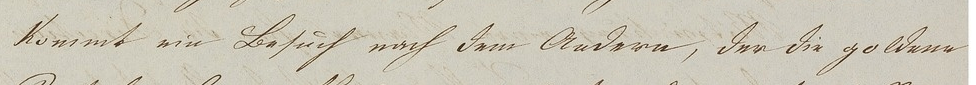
kommt ein Besuch nach dem Andern, der die goldene
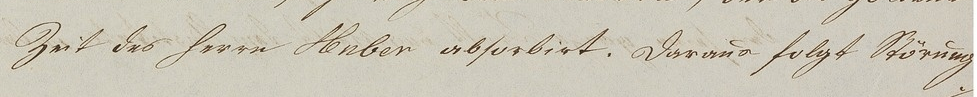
Zeit des Herrn Huber absorbirt. Daraus folgt Störung
